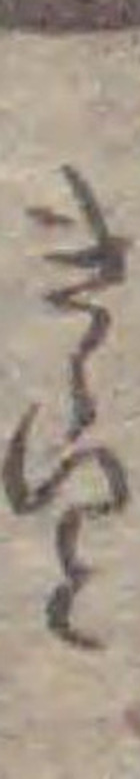きらいと
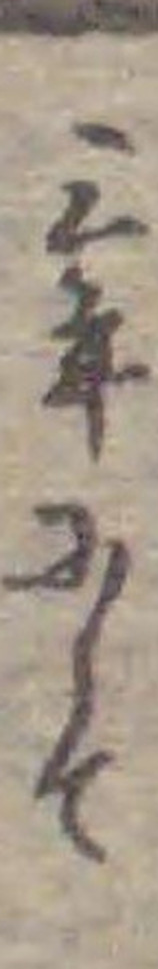三年にして
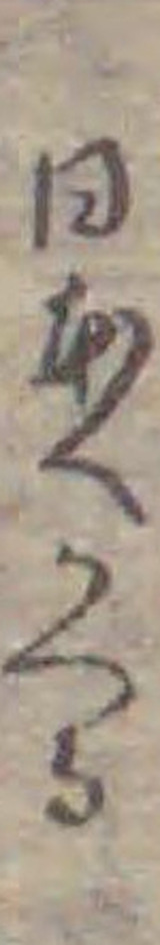日本へかへる

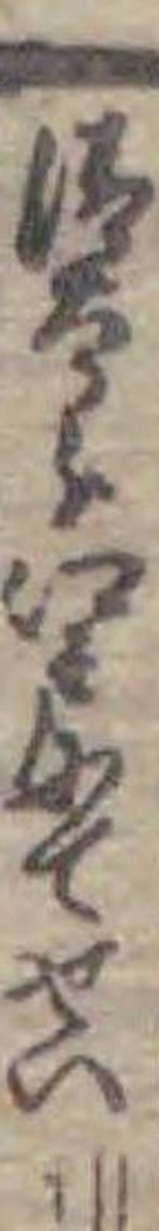清太郎江戸にてせい
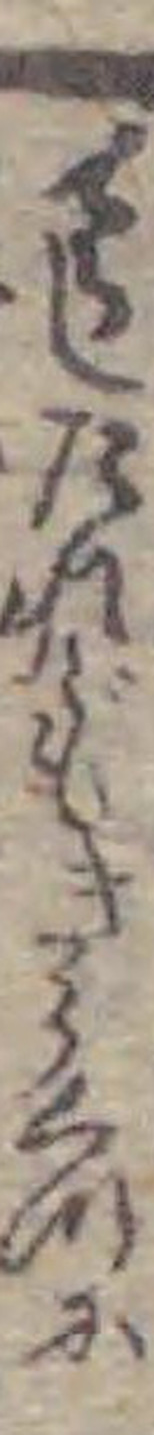てうしたれどもきうくつに
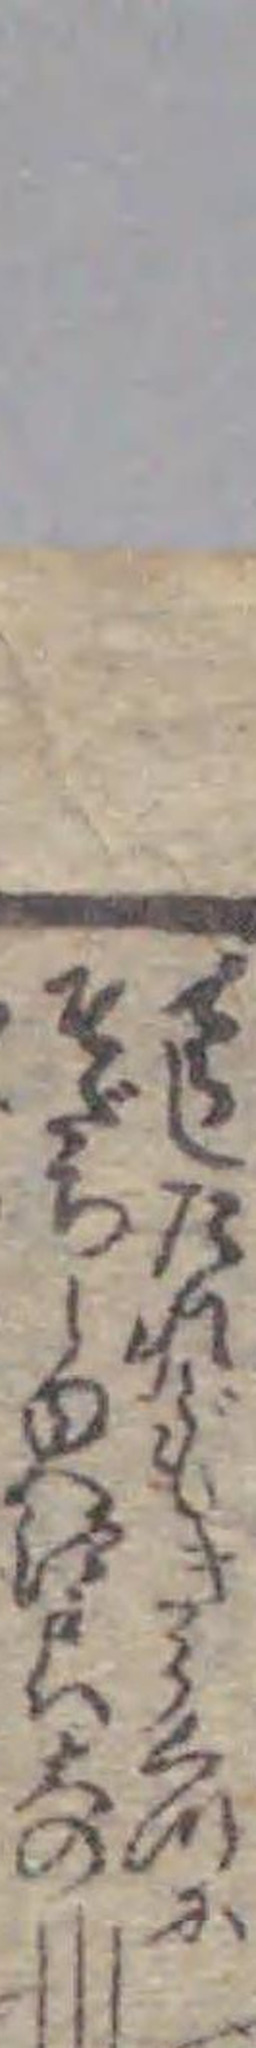そだちしゆへ江戸は大の
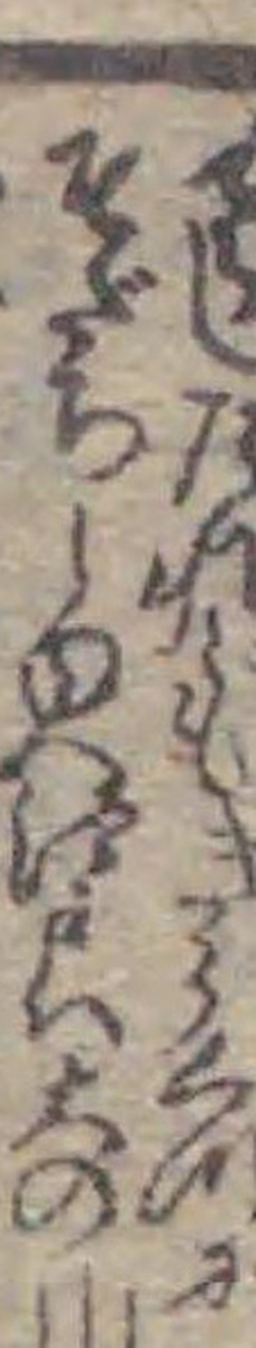そだちしゆへ江戸は大の
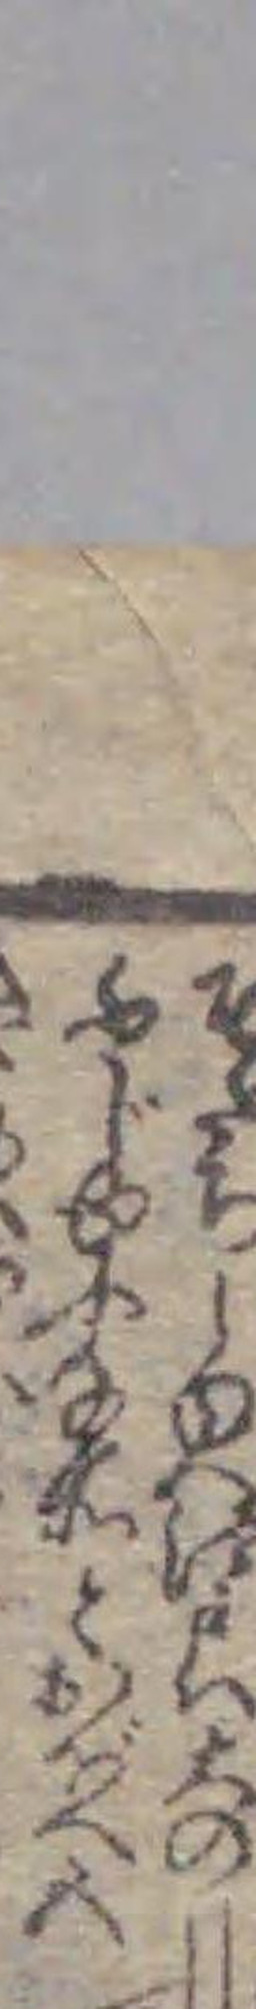ふじゆふな所とおぼへ五
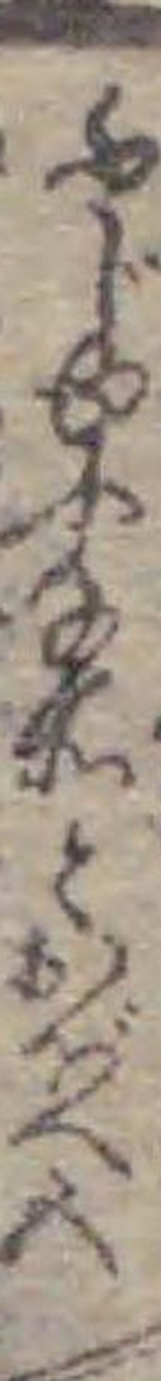ふじゆふな所とおぼへ五
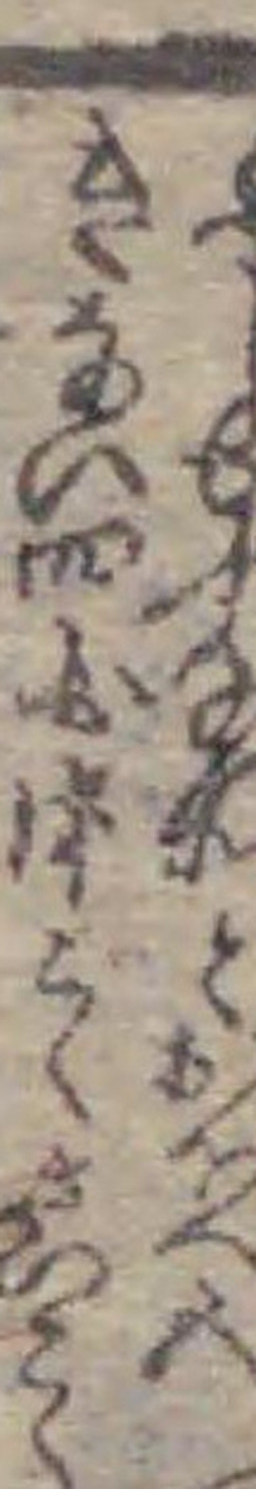きない四国中こくさいこく
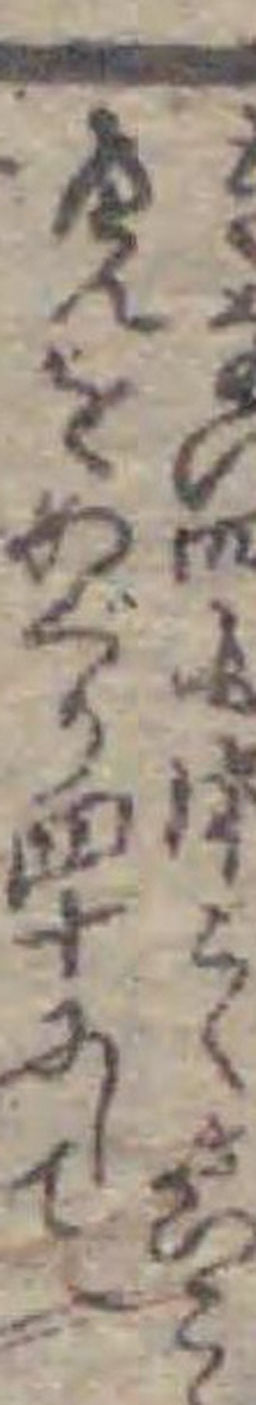へんをめぐり四十にして
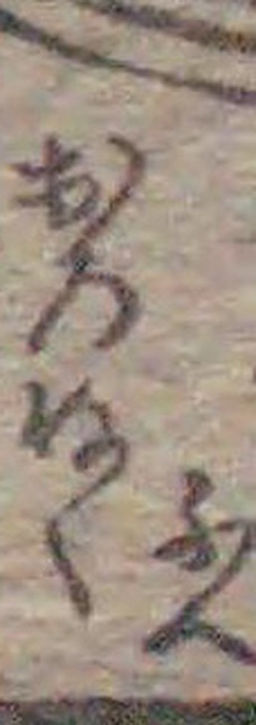おろぬく
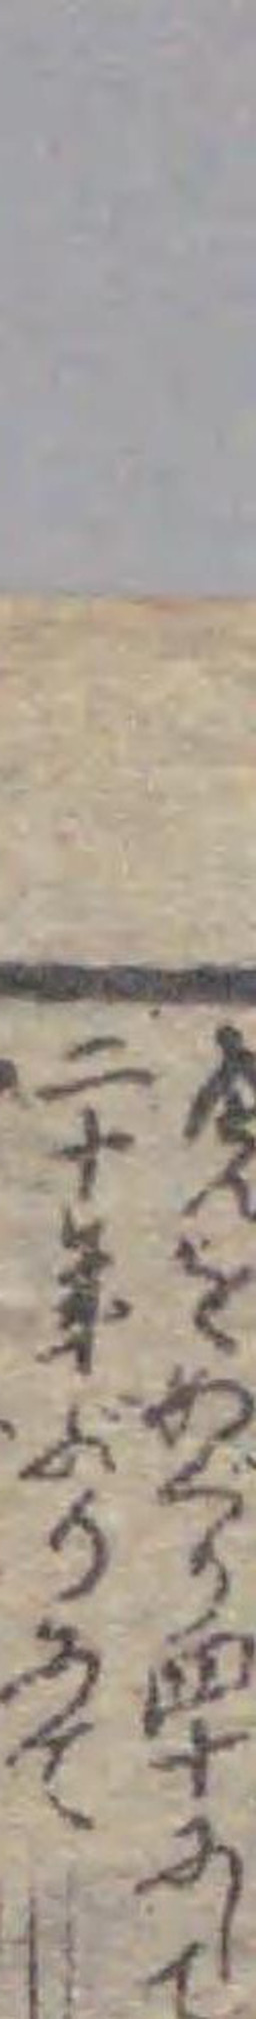二十年ぶりにて
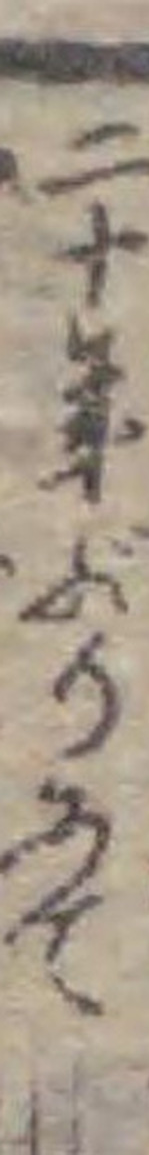二十年ぶりにて
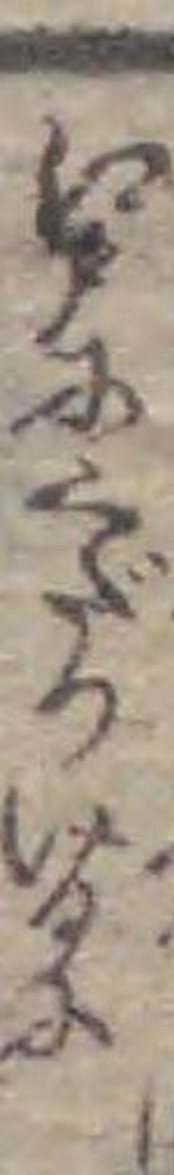江戸にくだりけるに
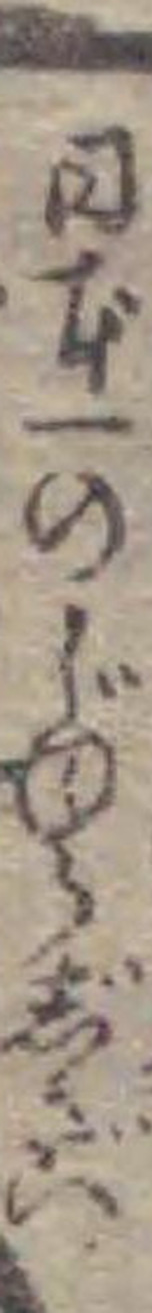日本一のじゆうじざい
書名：見徳一炊夢 : 3巻
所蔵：国立国会図書館 National Diet Library, JAPAN
